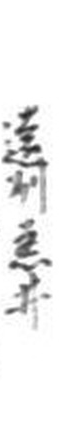遠州荒井
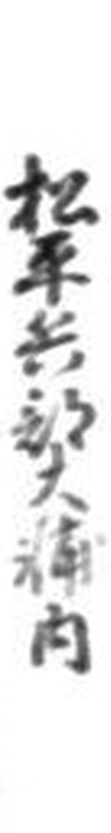松平兵部大輔内
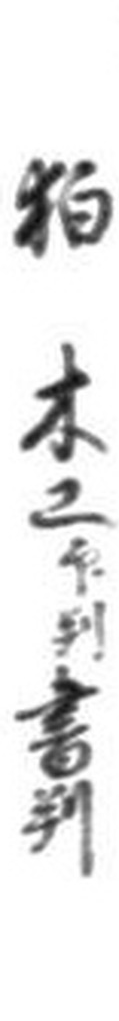狛木工印判書判
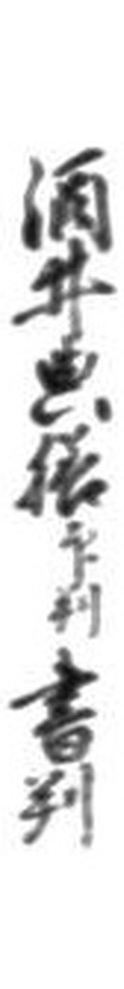酒井典膳印判書判
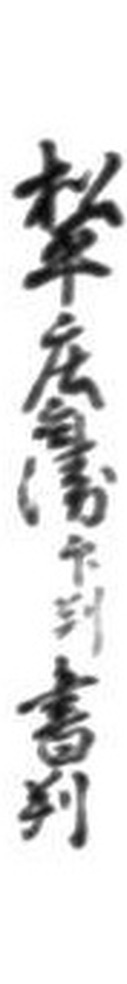松平庄兵衛印判書判
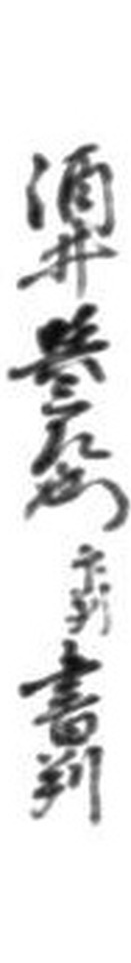酒井与三左衛門印判書判

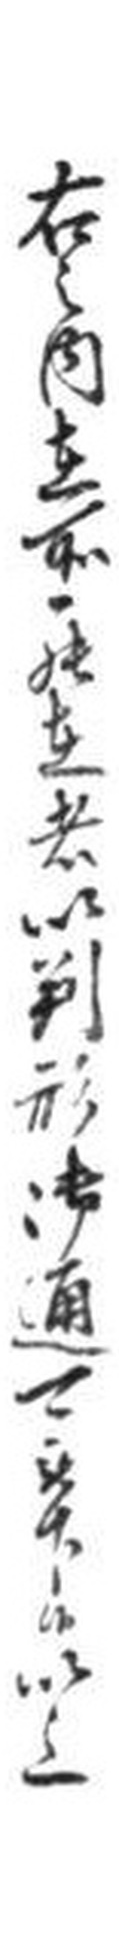右之内在所罷在者以判形御通可被下候以上
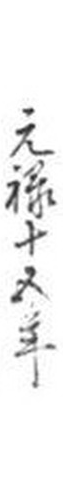元禄十五年
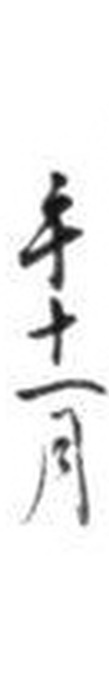午十一月
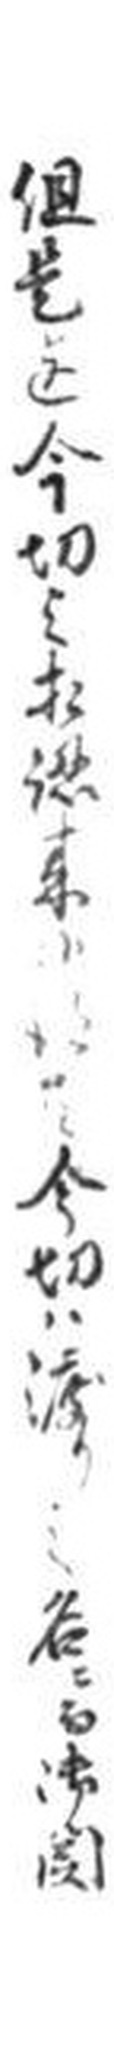但是迄今切与相認来候得共今切ハ渡り之名ニ而御関
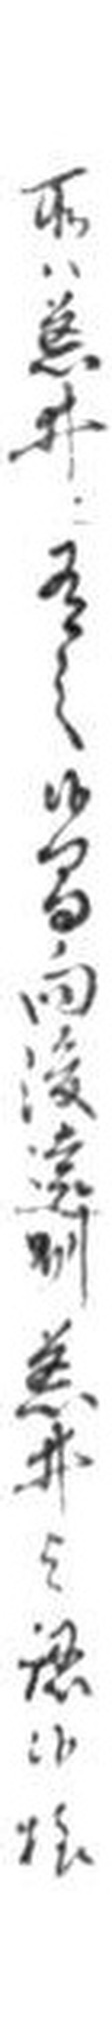所ハ荒井ニ有之候間向後遠州荒井与認候様
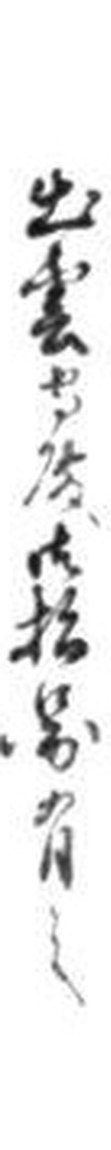出雲守殿御指図有之
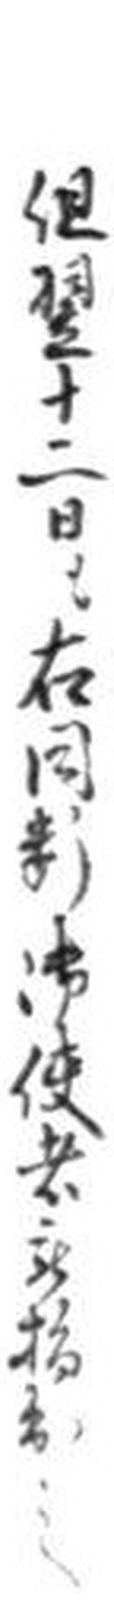但翌十二日も右同断御使者被指出之
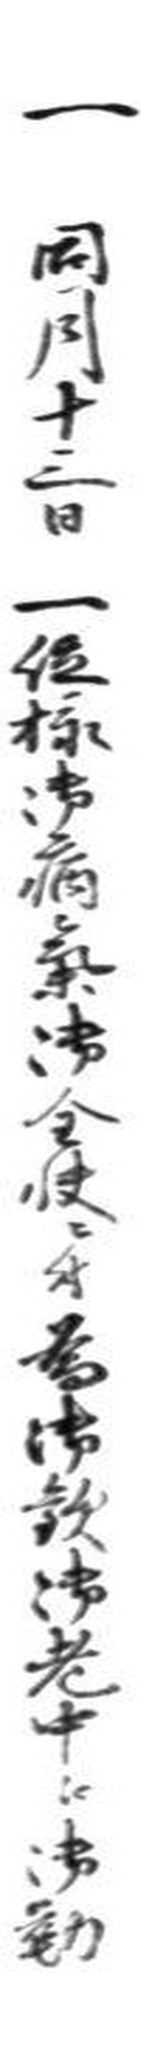一同月十三日一位様御病気御全快ニ付為御歓御老中江御勤
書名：家譜 二十二 吉品公 従元禄十五年到同十六年
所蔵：福井県文書館 Fukui Prefectural Archives
